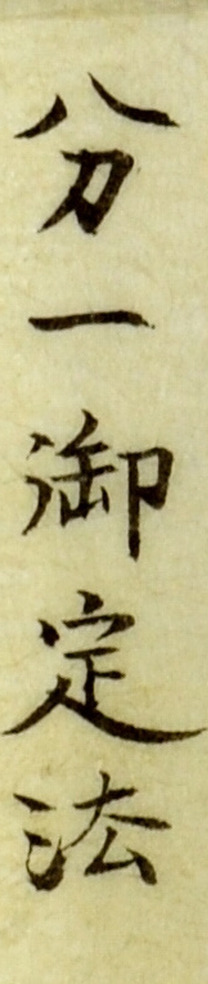分一御定法

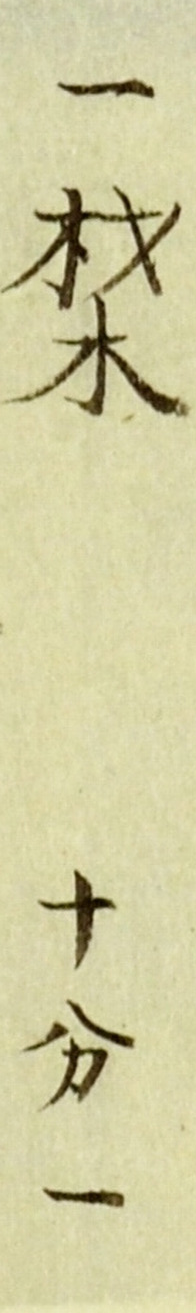一材木十分一
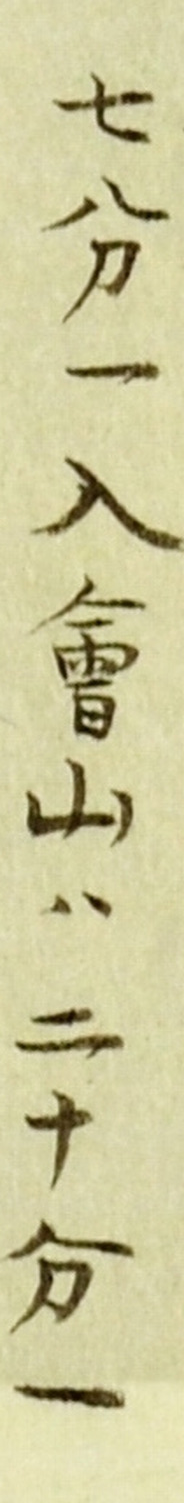七分一入会山ハニ十分一
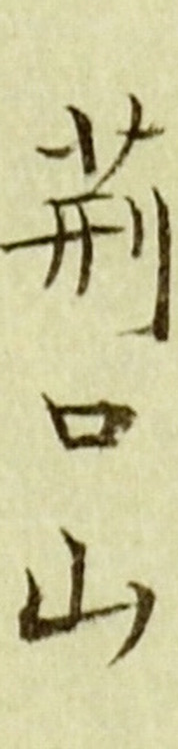荊口山
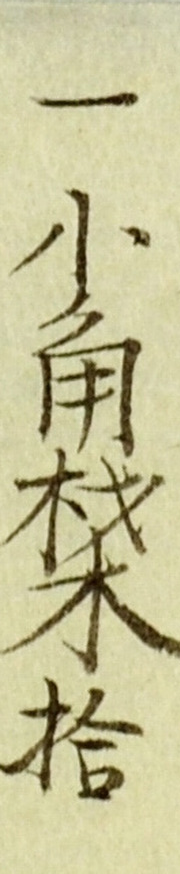一小角材木拾一本
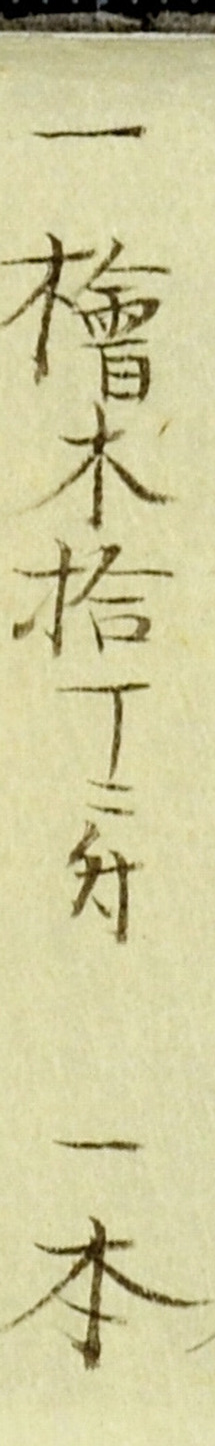一桧木拾丁ニ付一本
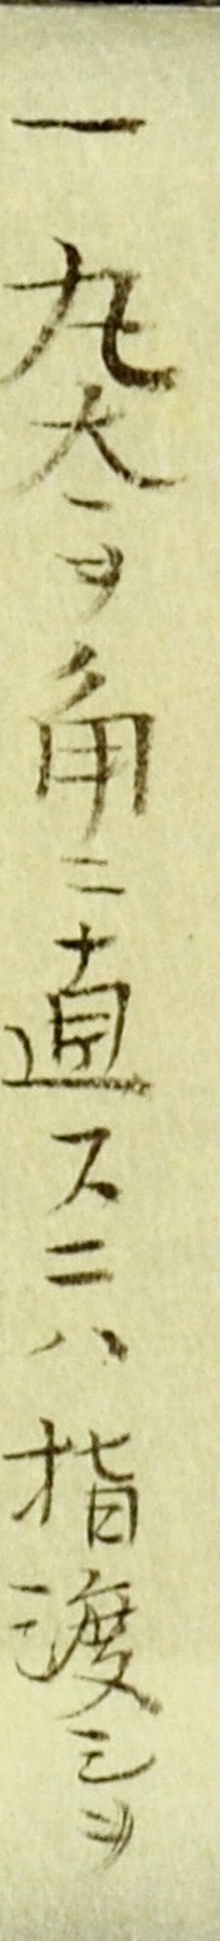一丸太を角ニ直スニハ指渡シヲ
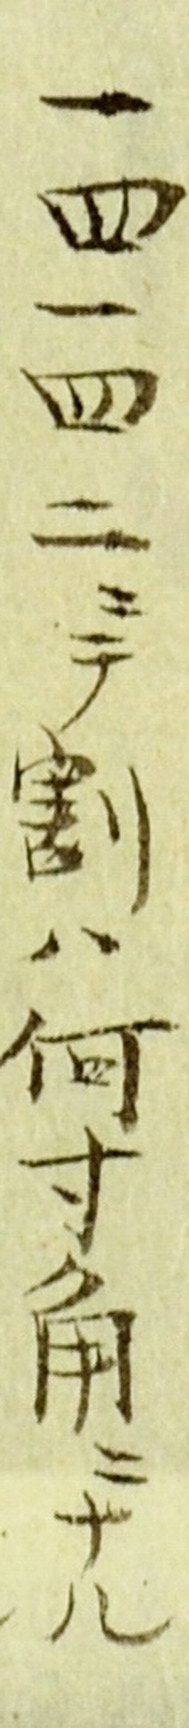一四一四二ニテ割ハ何寸角ニナル
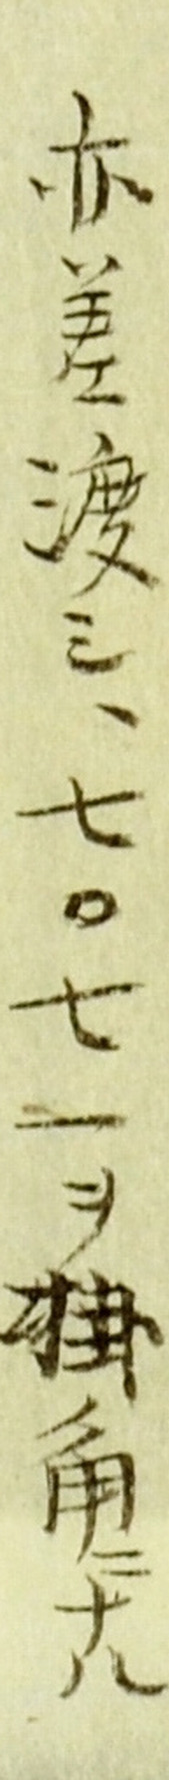亦差渡シ、七〇七一を掛角ニナル
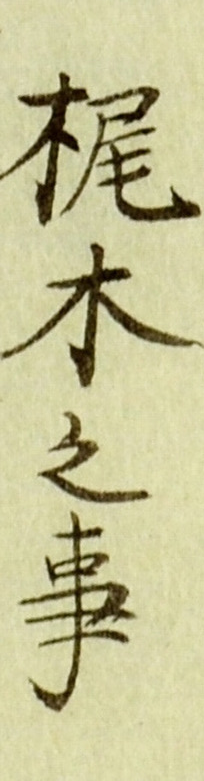梶木之事
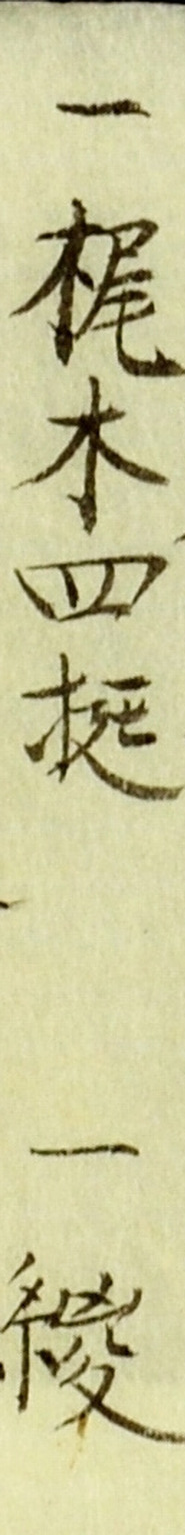一梶木四挺一緵
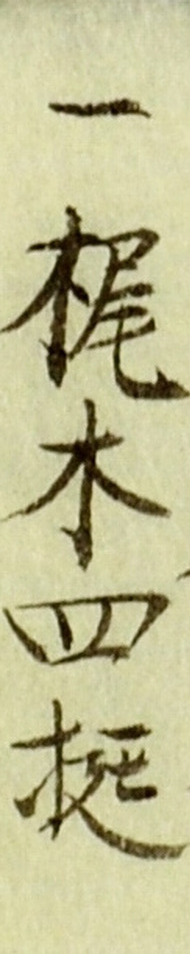一梶木四挺一緵
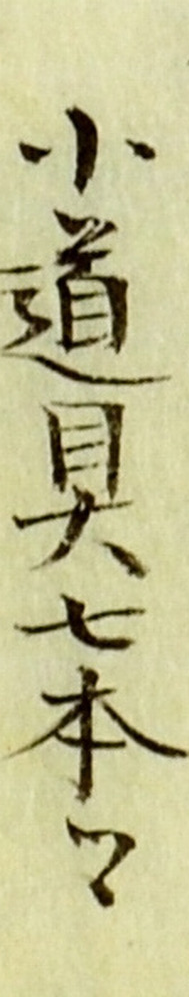小道具七本ツヽ
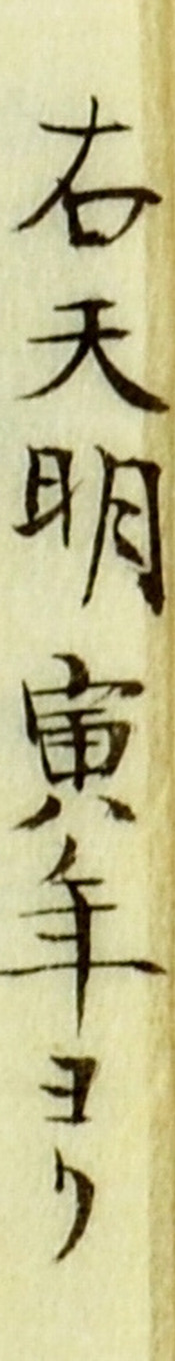右天明寅年ヨリ
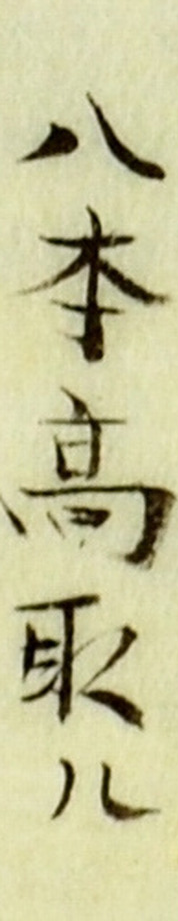八本高取ル
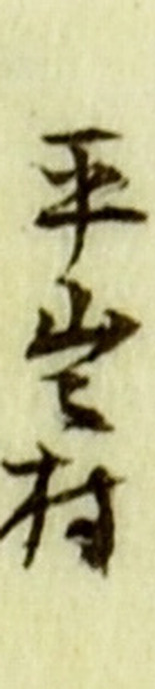平出村
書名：分一御定法
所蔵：伊那市立高遠町図書館・合同会社AMANE
